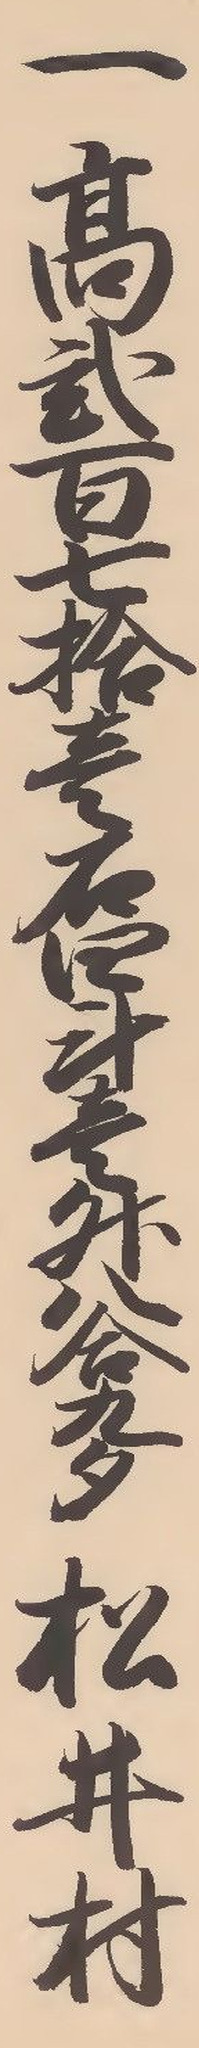一高弐百七拾壱石四斗壱升八合九勺松井村
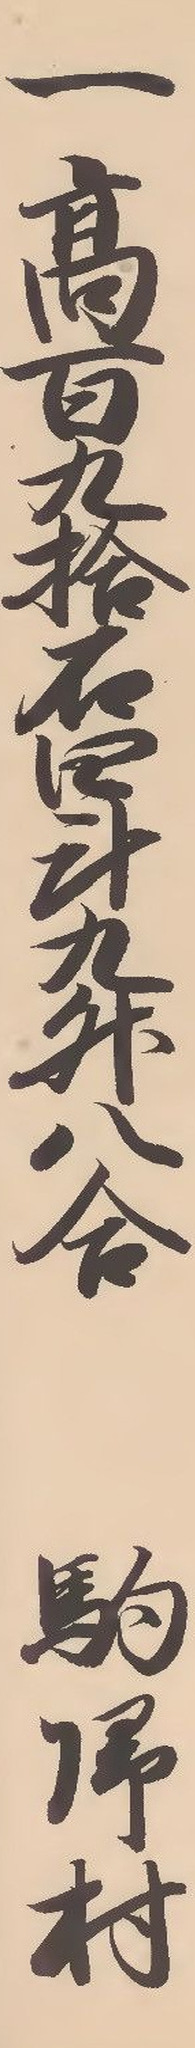一高百九拾石四斗九升八合駒帰村
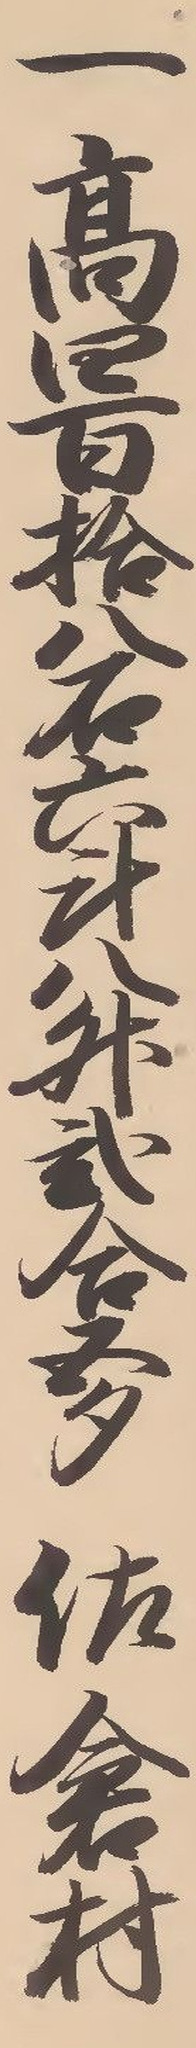一高四百拾八石六斗八升弐合五勺佐倉村
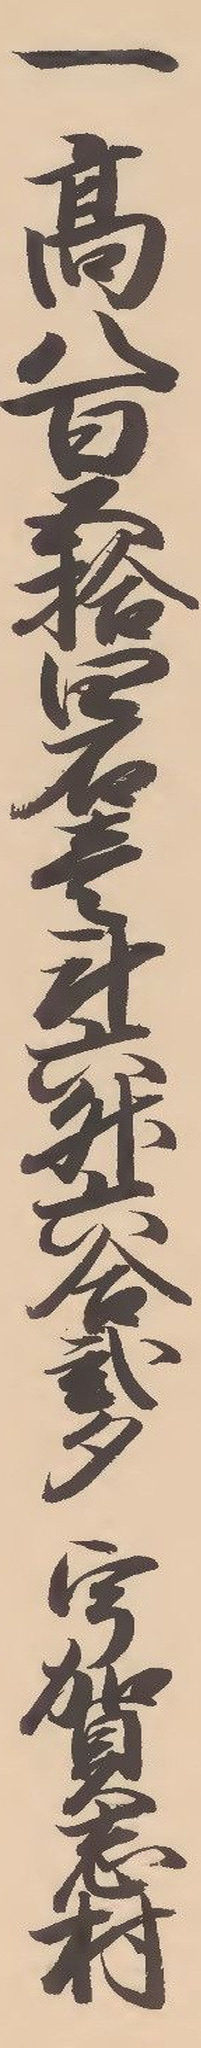一高八百五拾四石壱斗六升六合弐勺宇賀志村
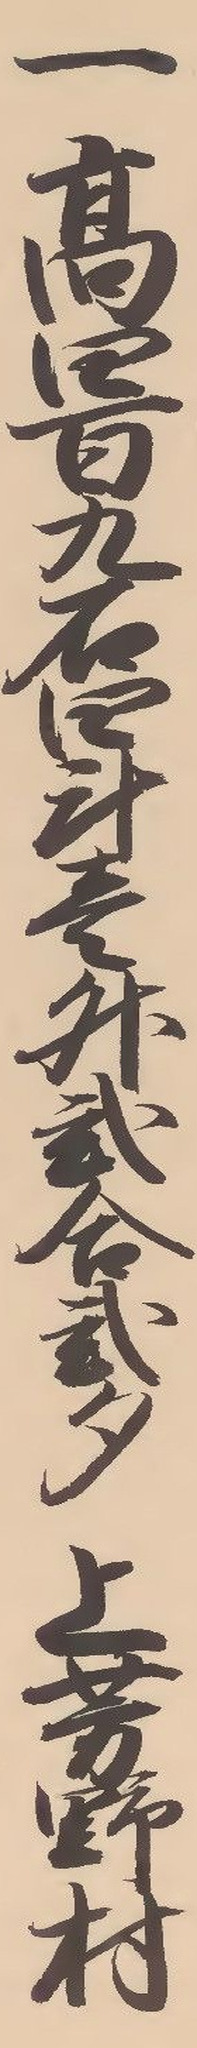一高四百九石四斗壱升弐合弐勺上芳野村
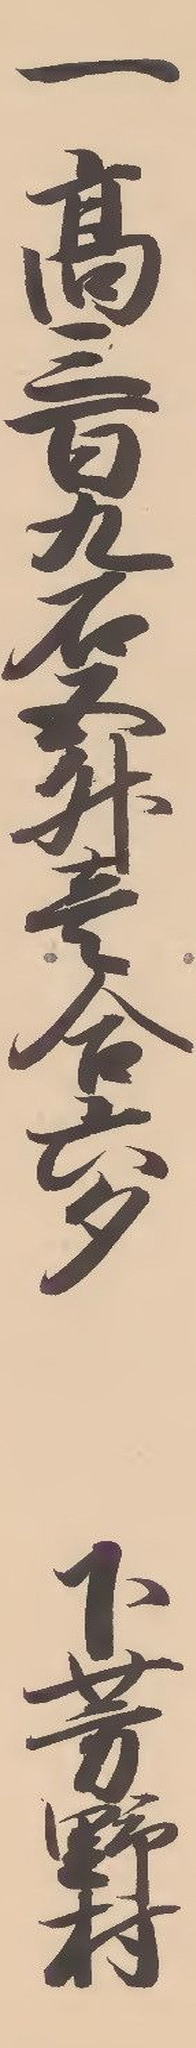一高三百九石五升壱合六勺下芳野村

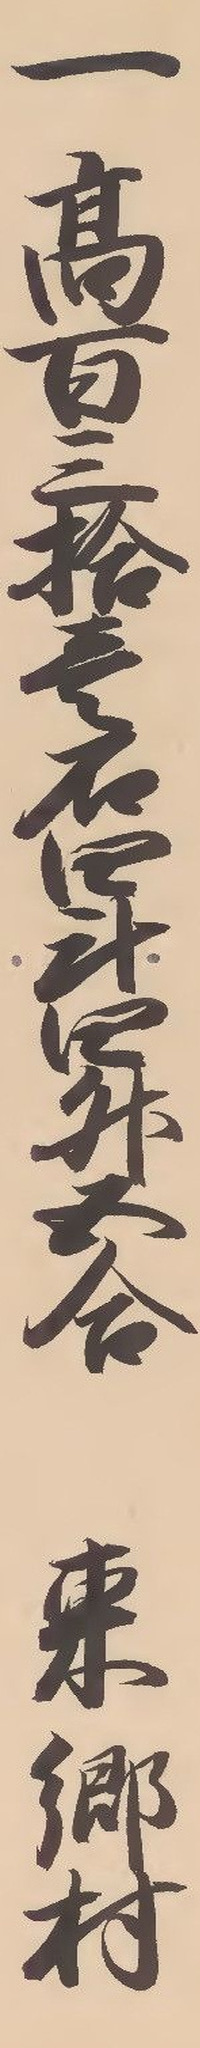一高百三拾壱石四斗四升五合東郷村
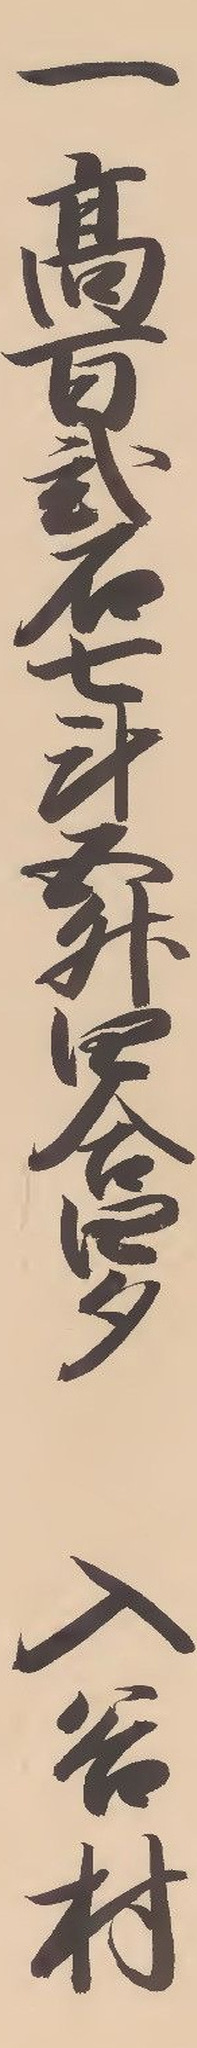一高百弐石七斗五升四合四勺入谷村
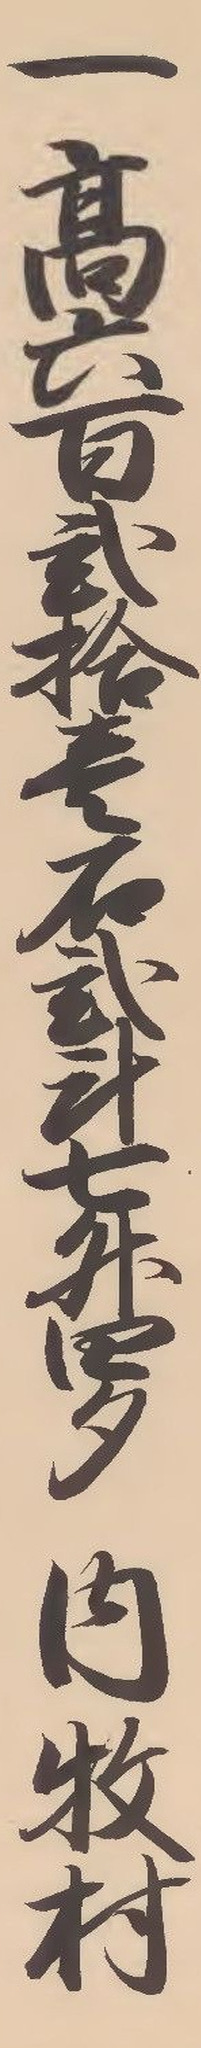一高六百弐拾壱石弐斗七升四勺内牧村
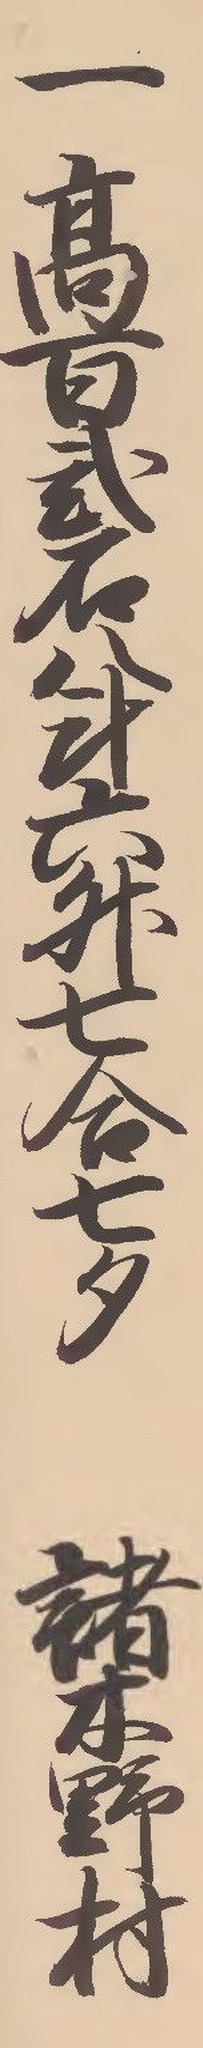一高百弐石八斗六升七合七勺諸木野村
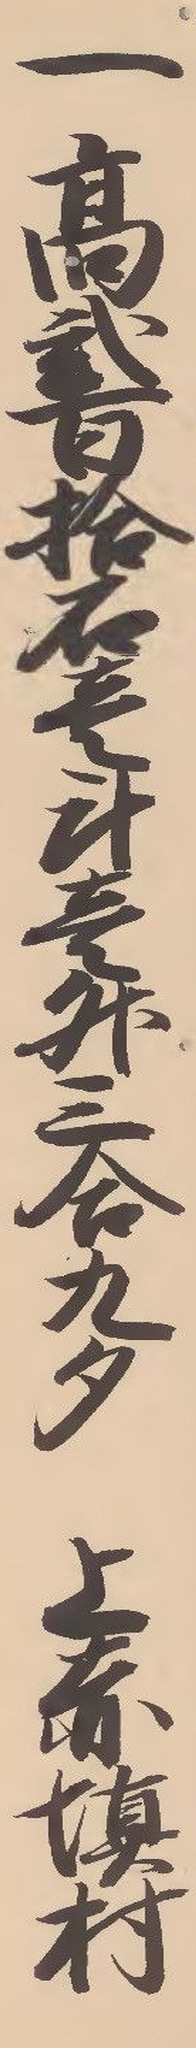一高弐百拾石壱斗壱升三合九勺上赤埴村
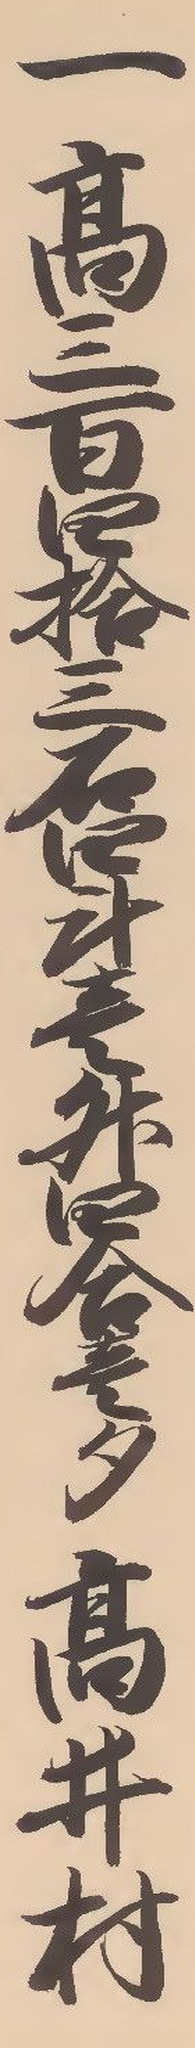一高三百四拾三石四斗壱升四合壱勺高井村

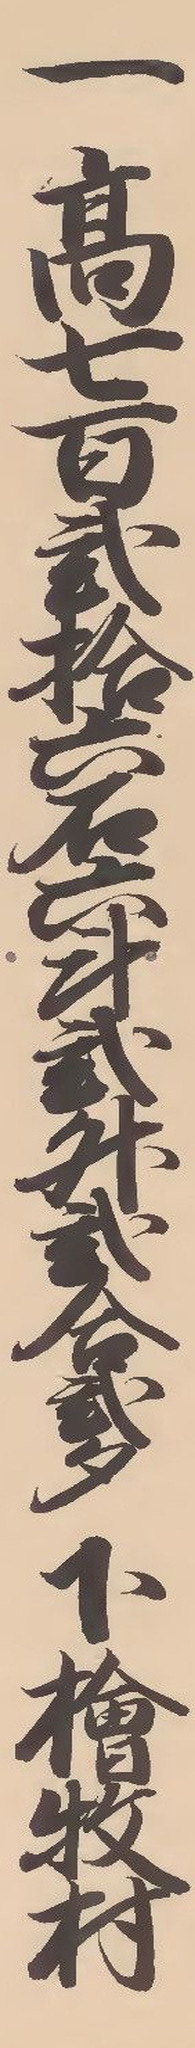一高七百弐拾六石六斗弐升弐合弐勺下桧牧村
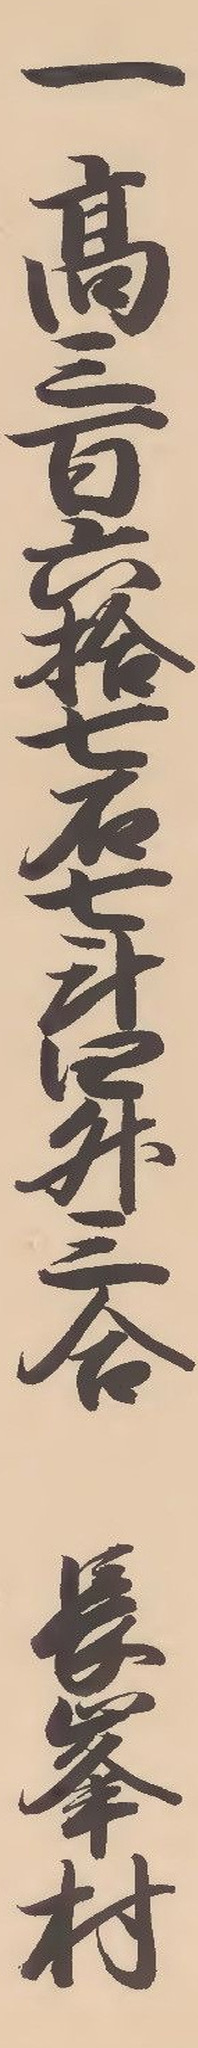一高三百六拾七石七斗四升三合長峰村
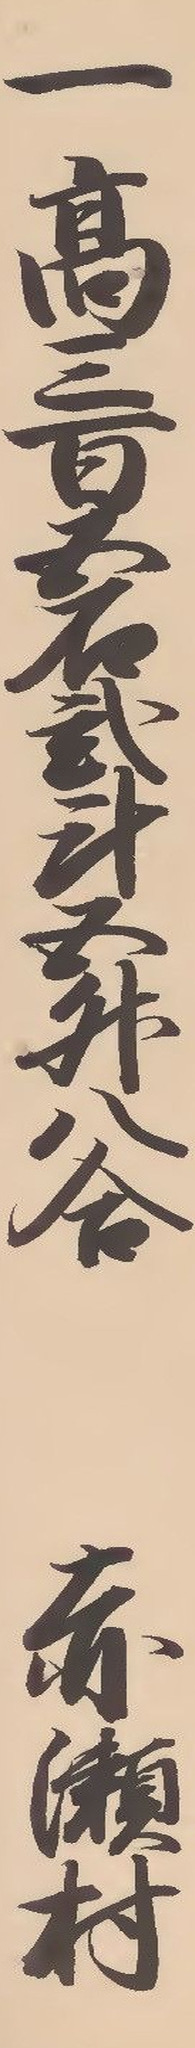一高三百五石弐斗五升八合赤瀬村
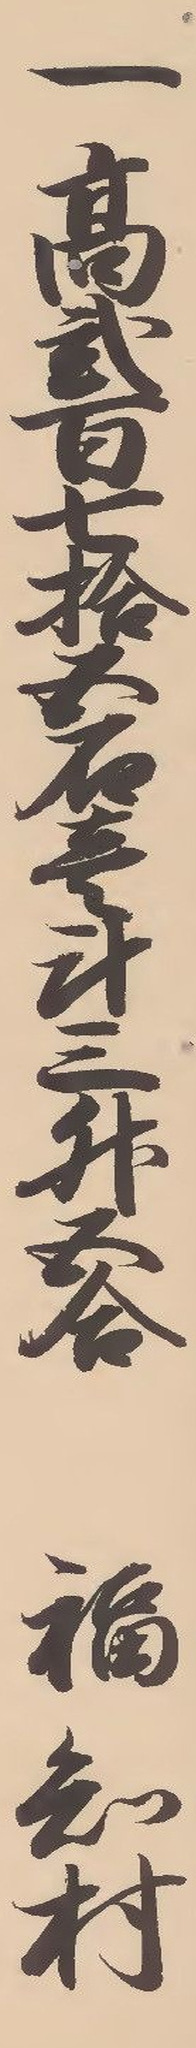一高弐百七拾五石壱斗三升五合福知村
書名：大和国郷帳
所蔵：国立公文書館 National Archives of Japan
